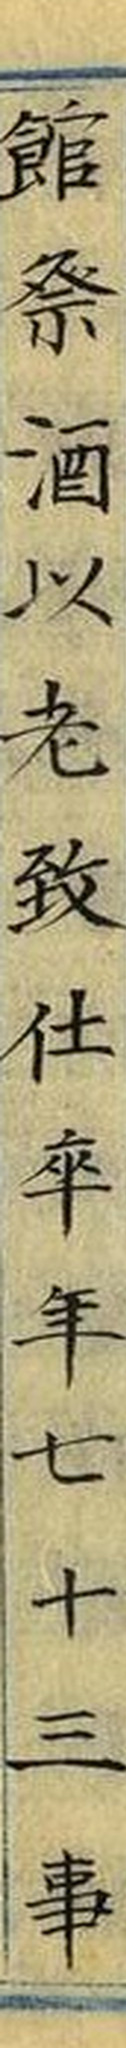館祭酒以老致仕卒年七十三事
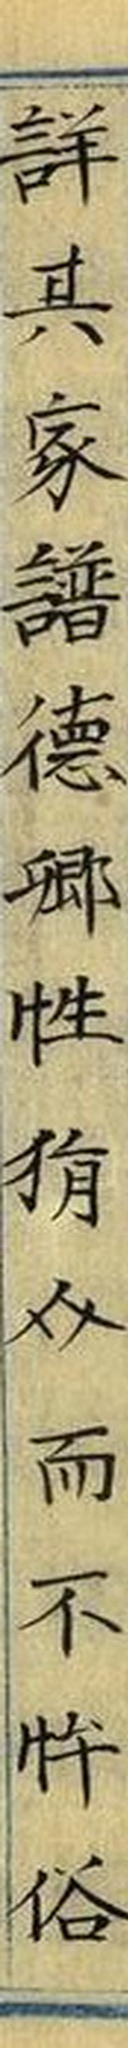詳其家譜德卿性狷介而不忤俗
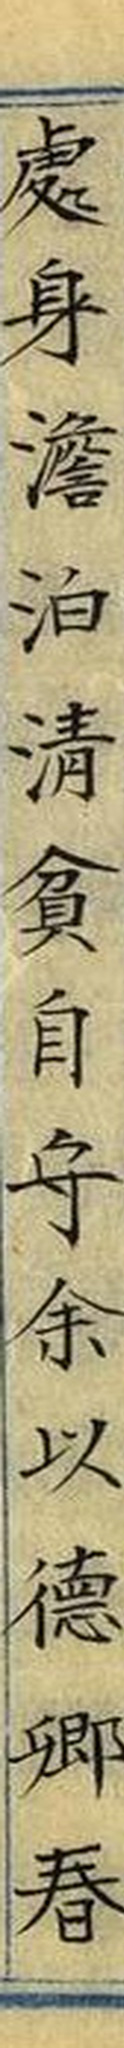處身澹泊淸貧自守余以德卿春
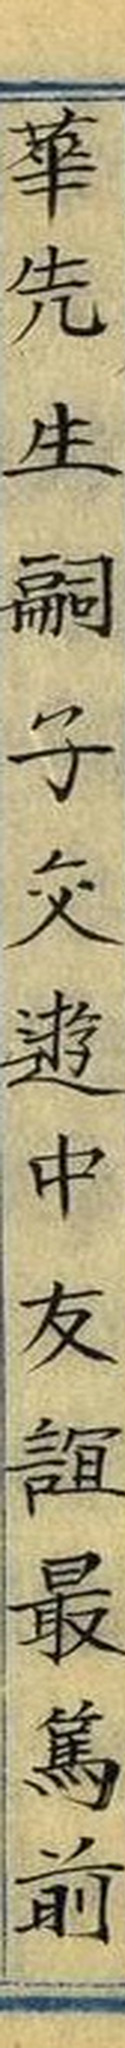蕐先生嗣子交遊中友誼最篤前
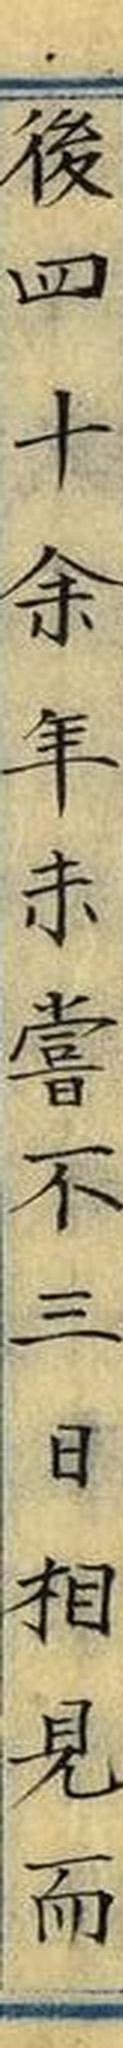後四十余年未嘗不三日相見而
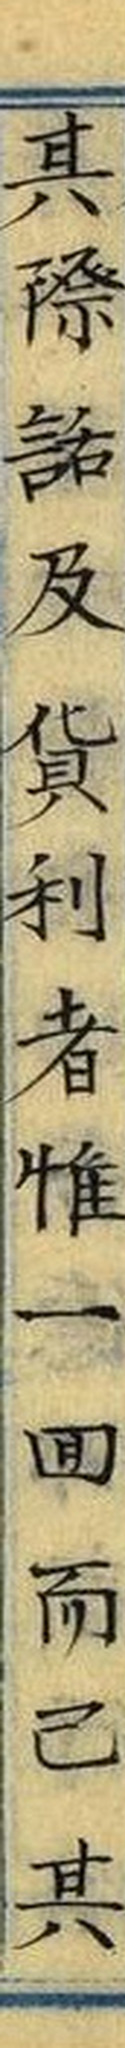其際話及貨利者惟一囬而已其

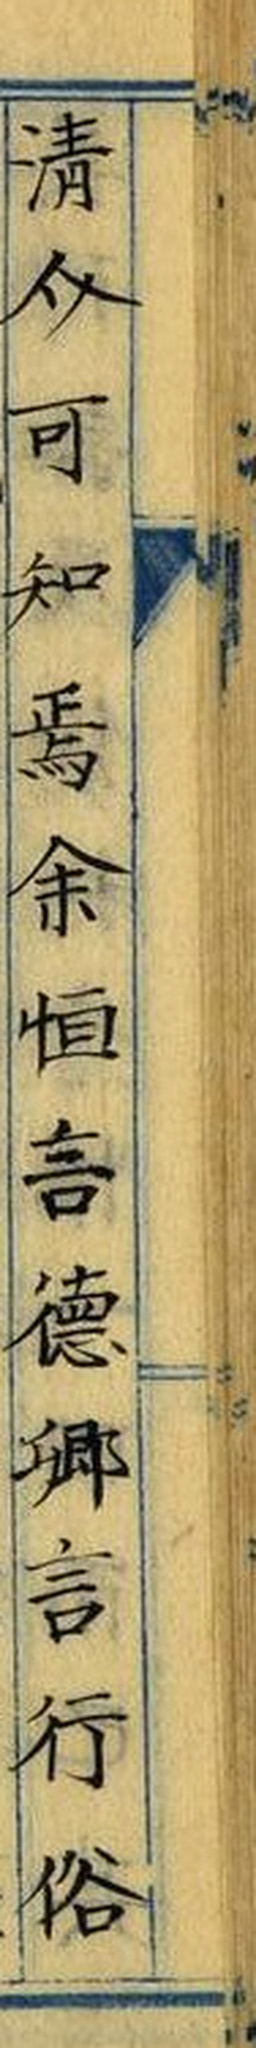淸介可知焉余恒言德卿言行俗
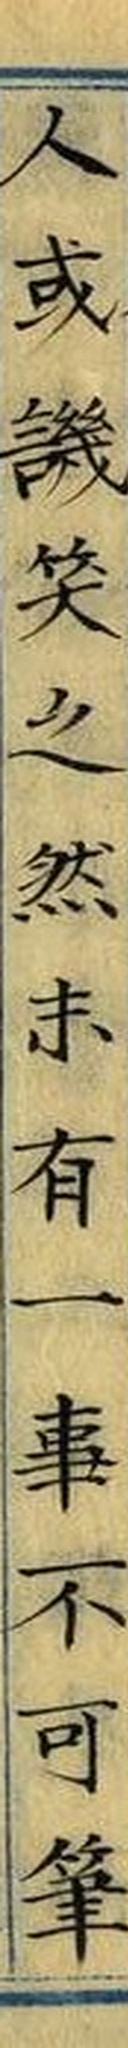人或譏笑之然未有一事不可筆
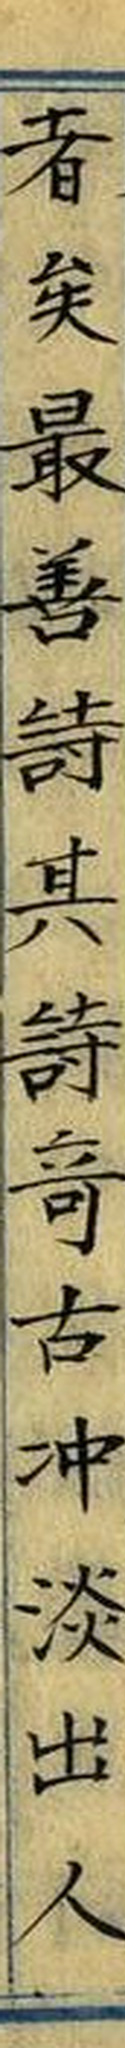者矣最善詩其詩竒古冲淡出人
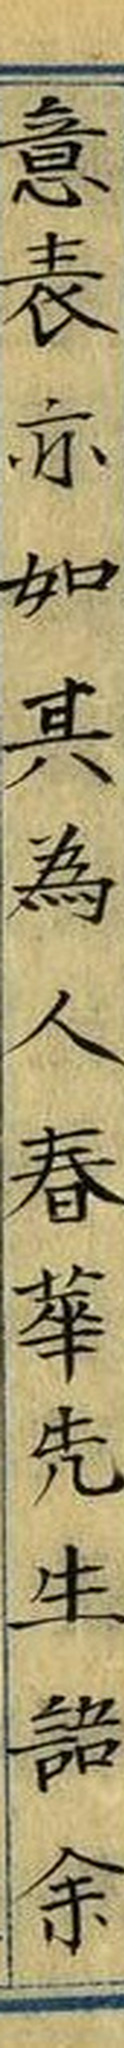意表亦如其為人春蕐先生語余
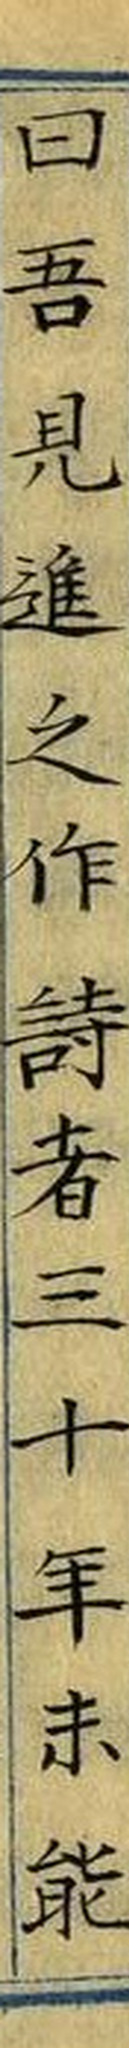曰吾見進之作詩者三十年未能
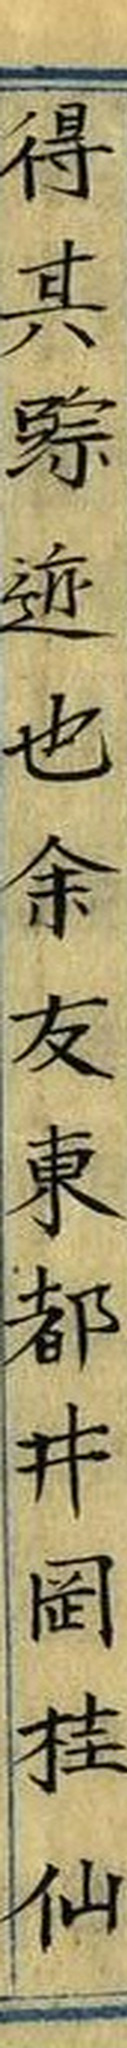得其踪迹也余友東都井岡桂仙
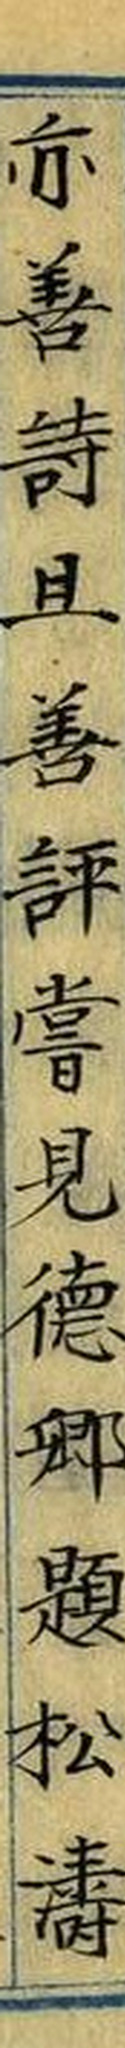亦善詩且善評嘗見德卿題松濤
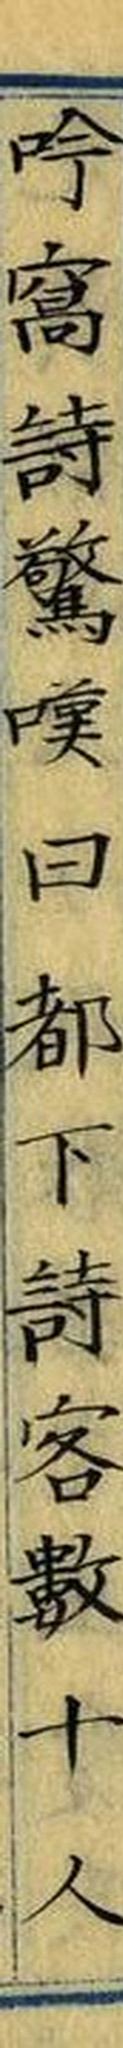吟窩詩驚嘆曰都下詩客數十人
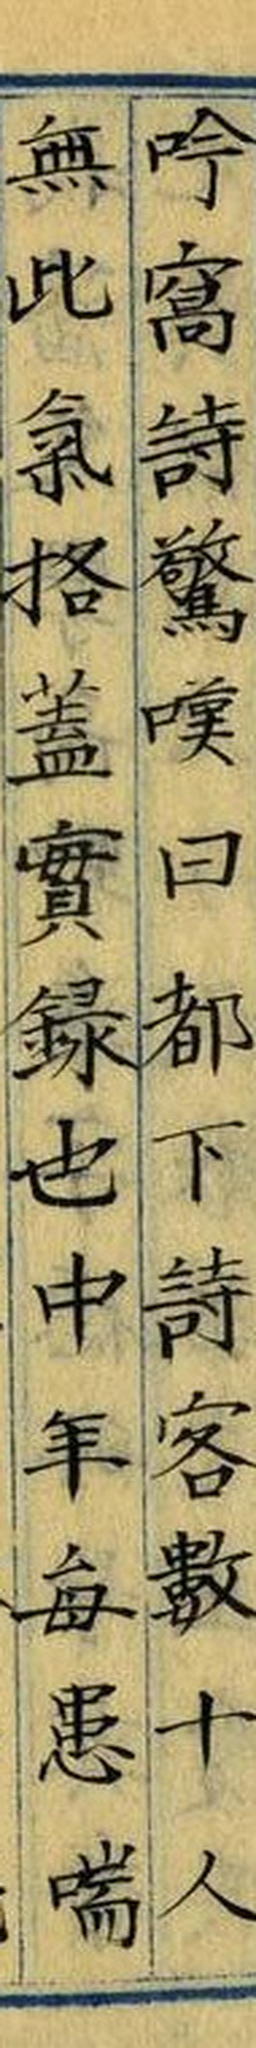無比氣挌蓋實録也中年毎患喘
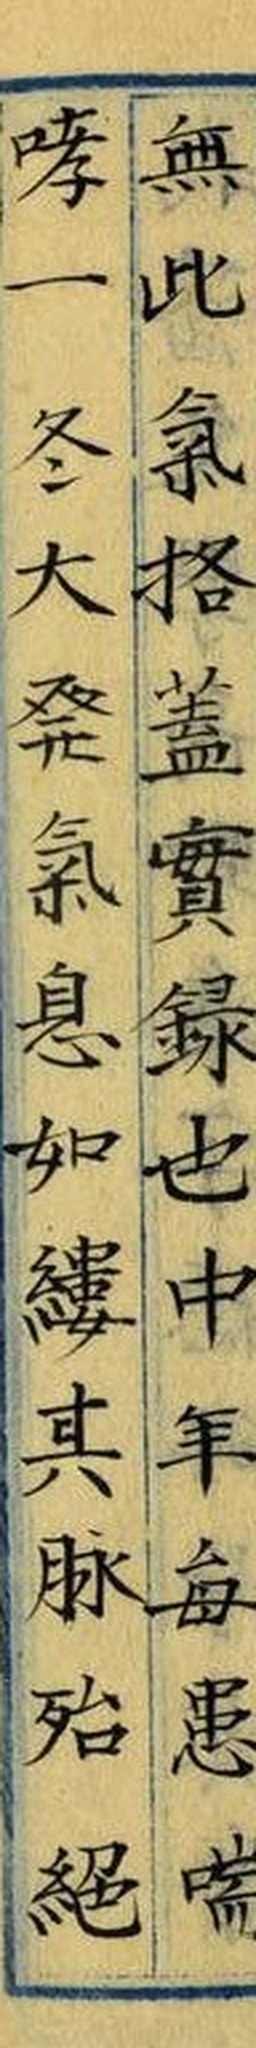哮一冬大発氣息如縷其脉殆絶
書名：温古集 四巻
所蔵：福井県文書館 Fukui Prefectural Archives
